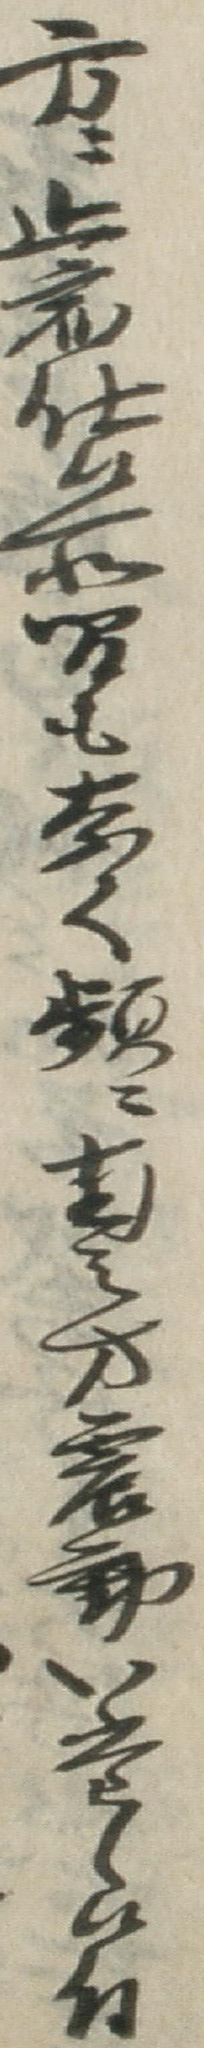方二止宿仕候所間もなく頻二南之方震動いたし候付
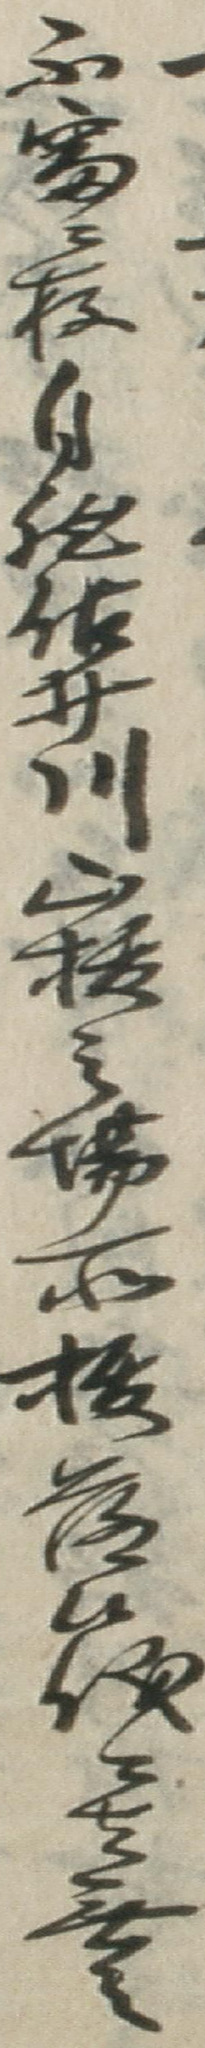不審二存自然佐井川山抜之場所抜落候儀二は無之
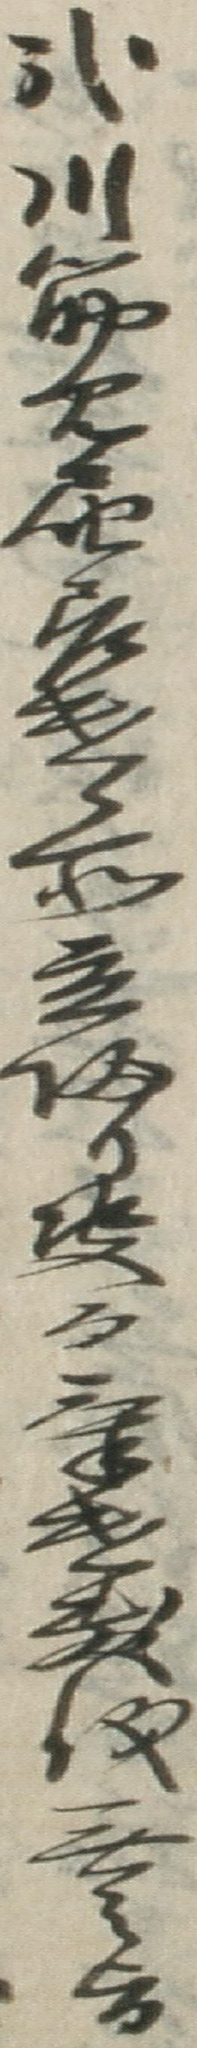哉川筋見届差遣候所立帰決而気遣敷儀無之旨
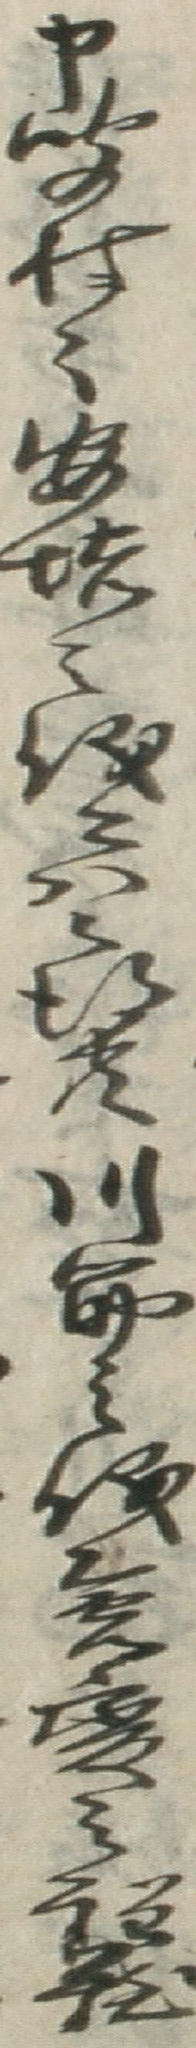申聞村々安堵之儀二ハ候得共川筋之儀急変之程難
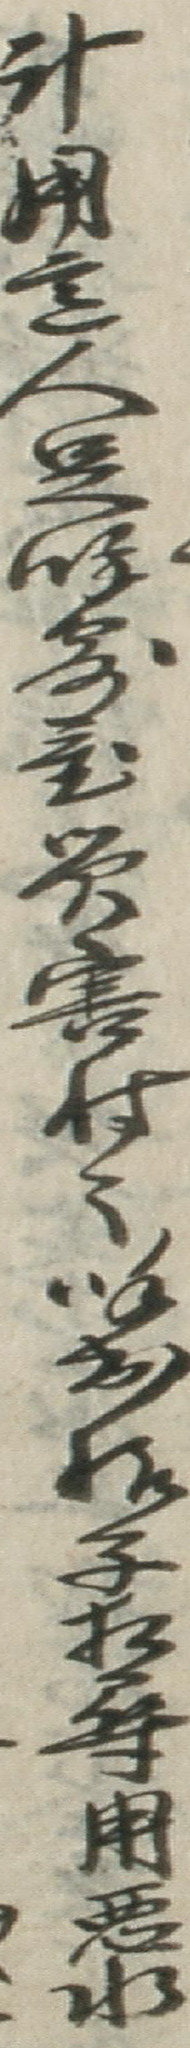計用意人足呼寄置災害村々呼出様子相尋用悪水
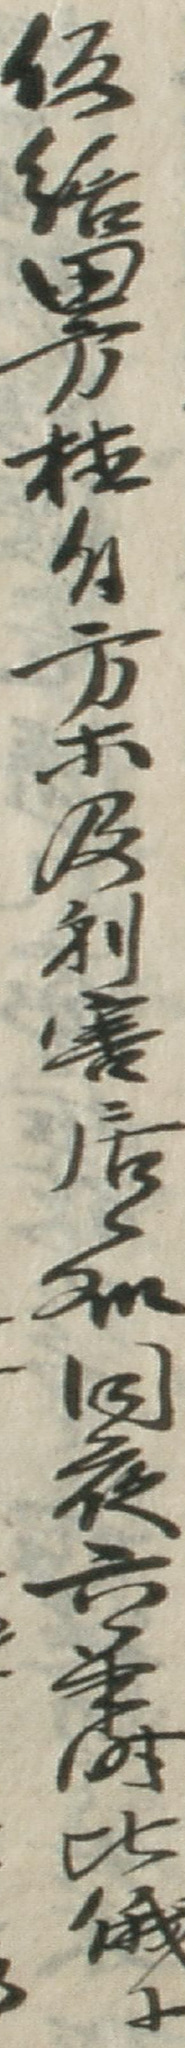仮結田方植付方等及利害居候処同夜六半時比俄に
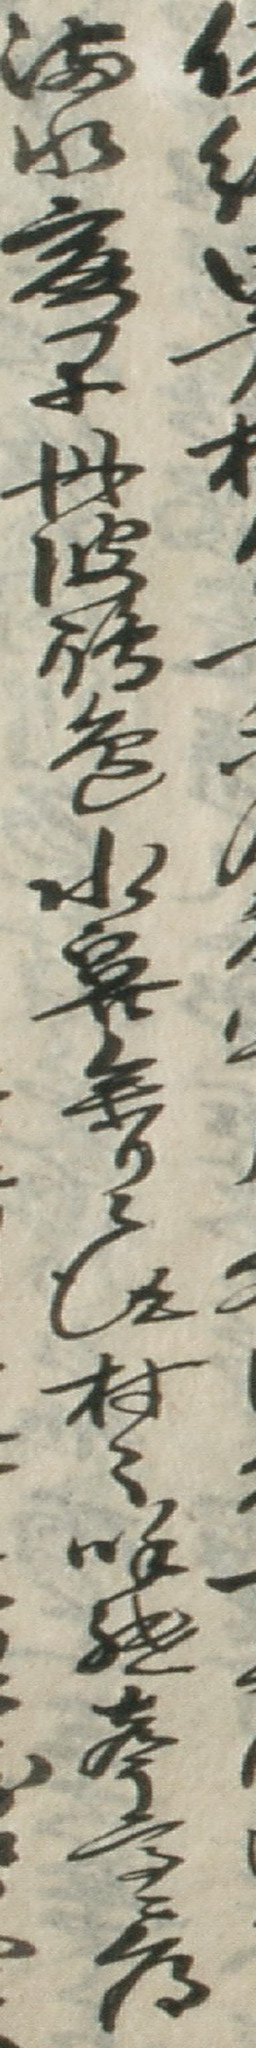満水最早丹波嶋辺水鼻参り候趣村々呼遣声高二為
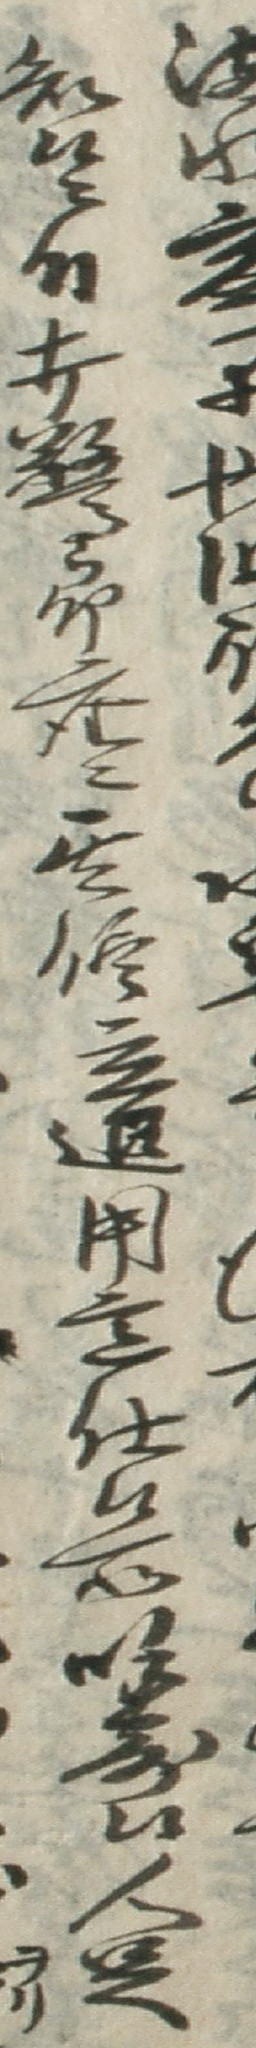知候付打驚即座二其儘立退用意仕候所呼寄候人足
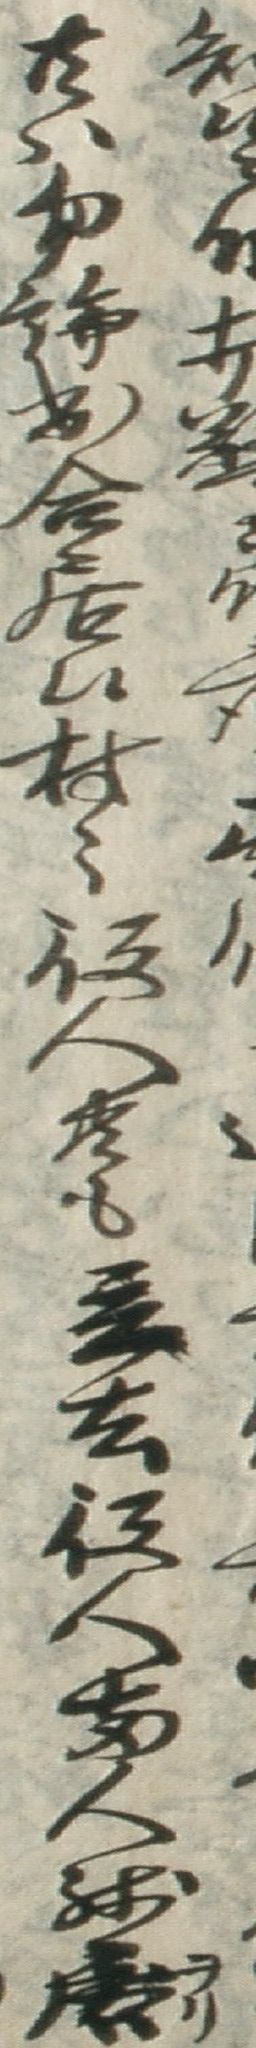共ハ勿論出合居候村々役人共も立去役人両人残居
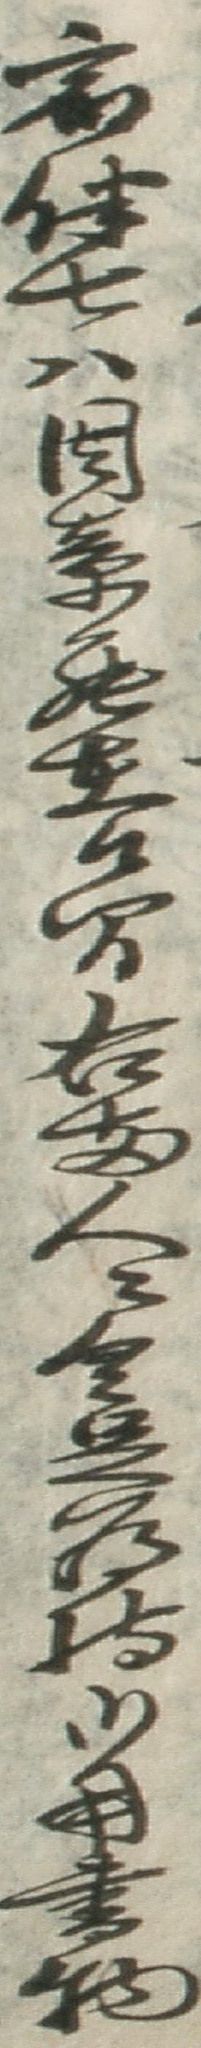宿伴七ハ周章罷在候間右両人二具足為持御用書物
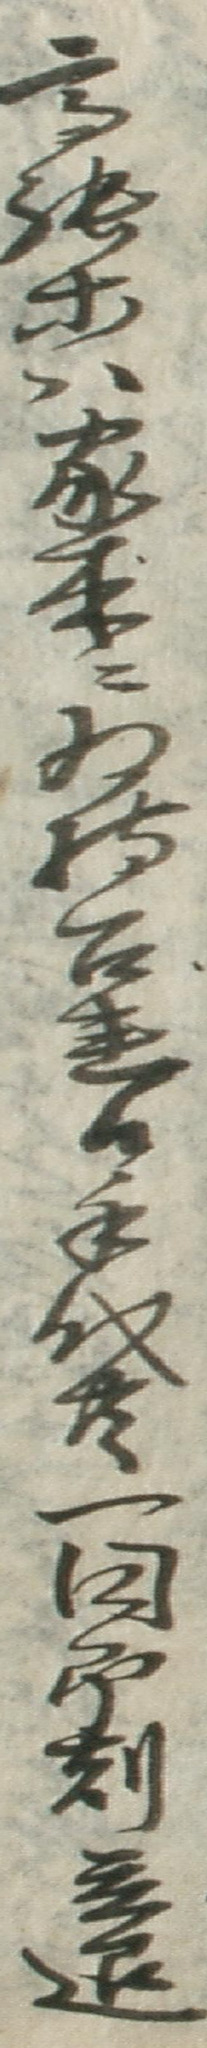高張等ハ家来二為持召連候手代共一同即刻立退
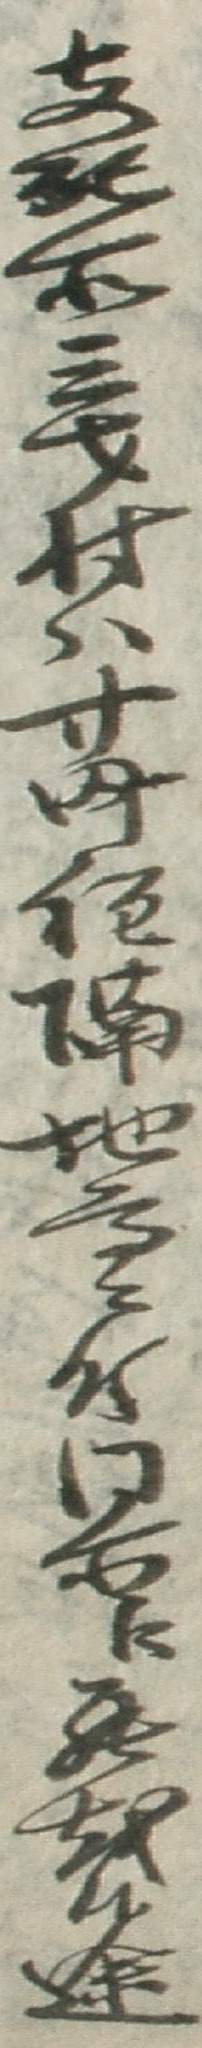支配所三才村ハ廿町程隔地高二付同所江罷越候途
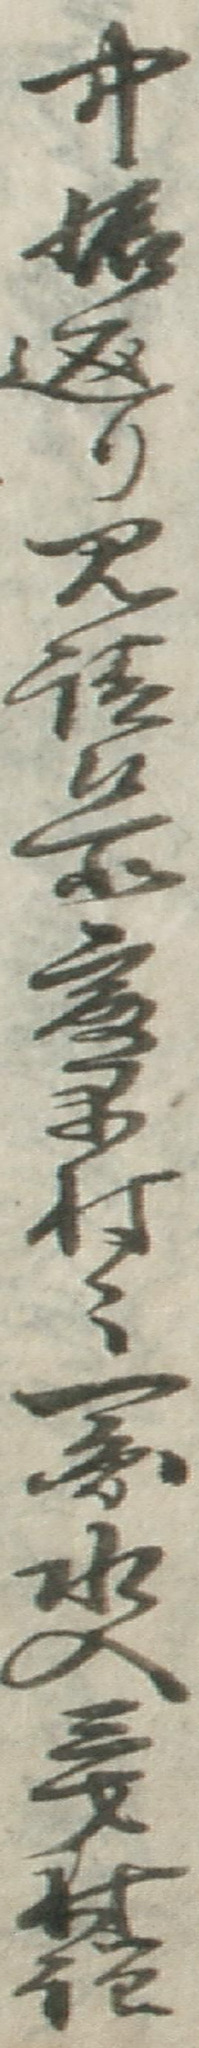中振返り見請候所最早村々一円水入三才村程
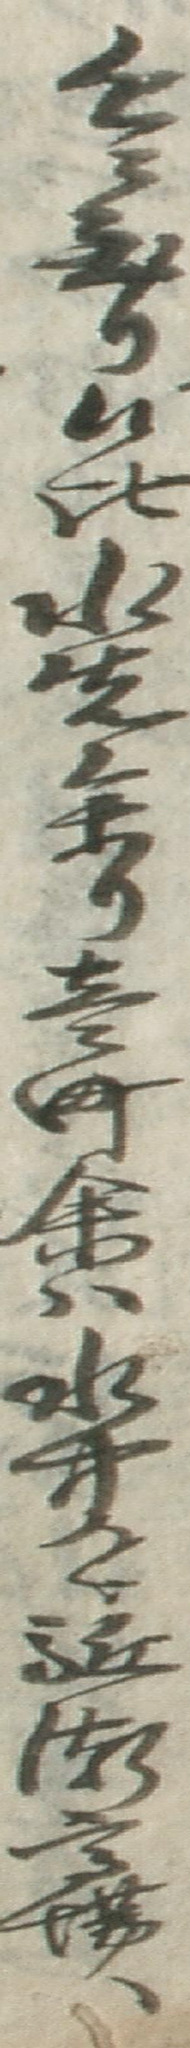近二至り候比水先参り壱町余ハ水中を駆漸高場へ
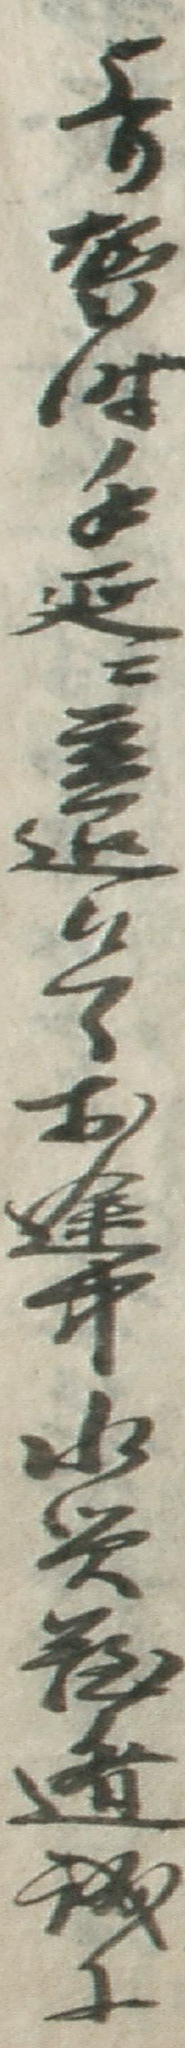上り暫時手延二立退候ハゝ於途中水災難遁誠に

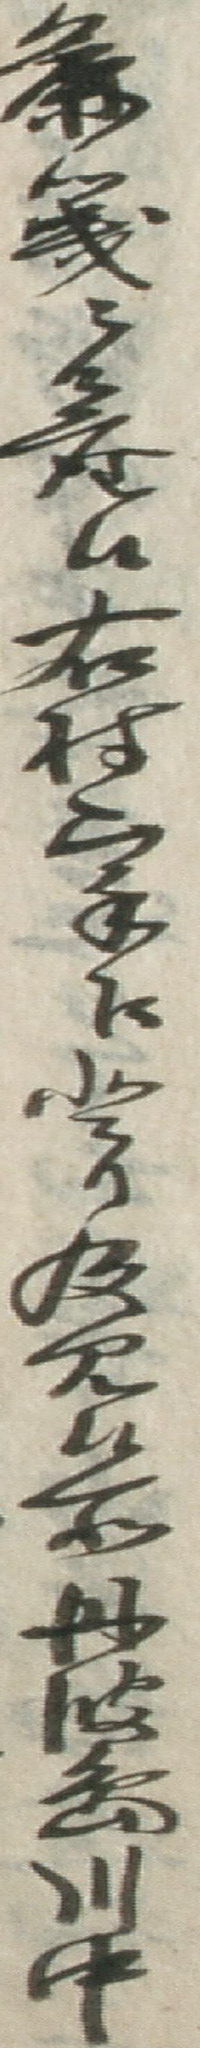廉幾二御座候右村山手江登り及見候所丹波島川中
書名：信濃國地震實録記
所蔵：東京大学地震研究所図書室 Earthquake Research Institute Library, The University of Tokyo, JAPAN
